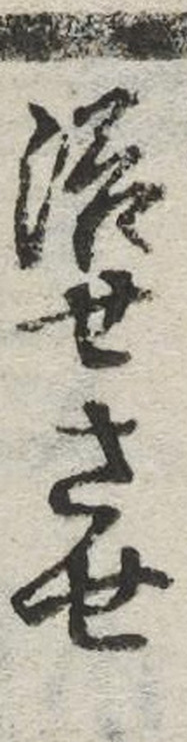浴せさせ
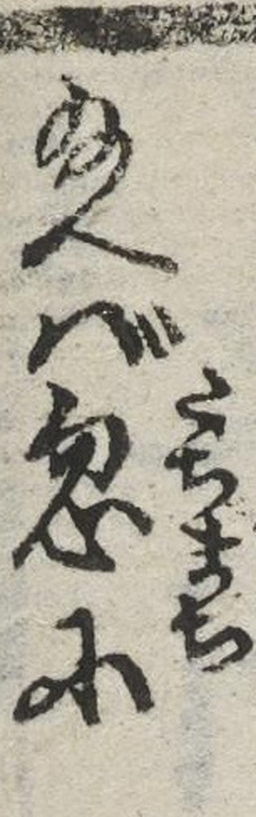給へバ忽に
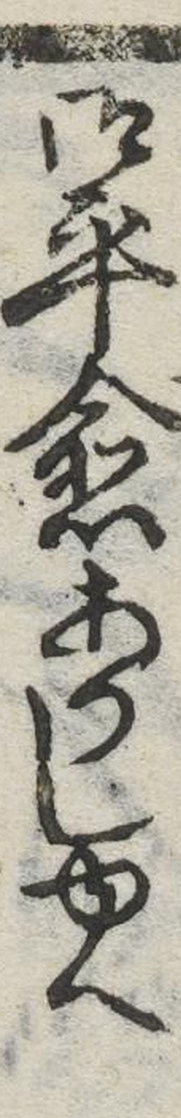御平癒ありしゆへ
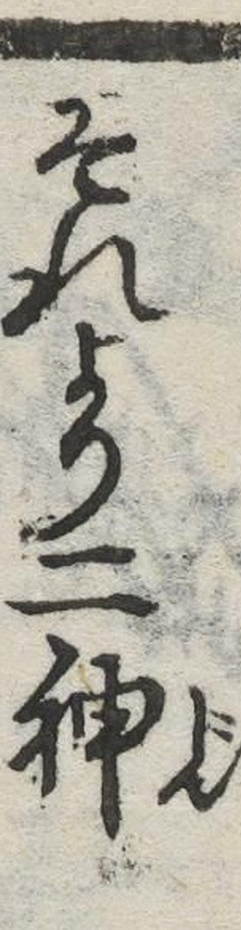それより二神
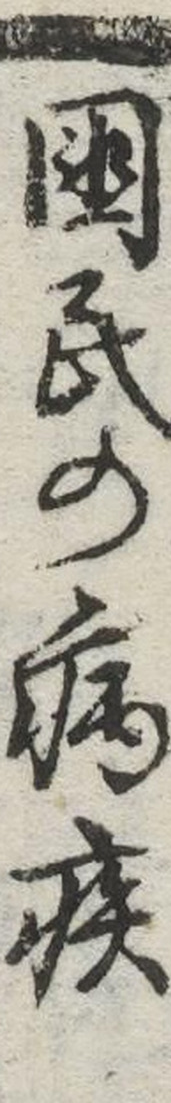國民の病疾
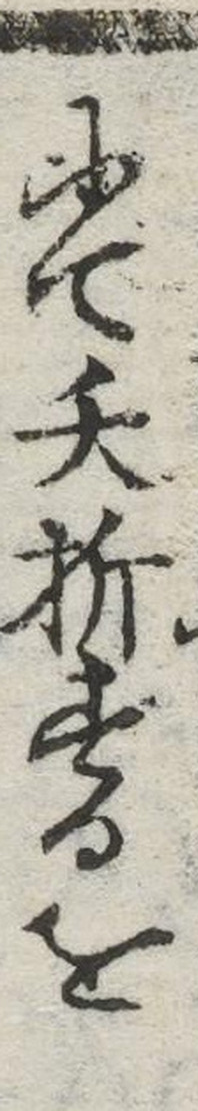にて夭折するを
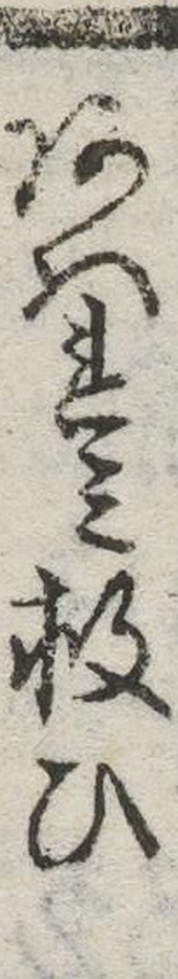あはれみ救ひ
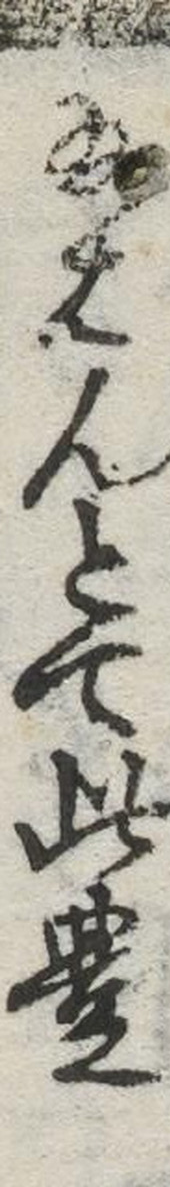給はんとて此豊
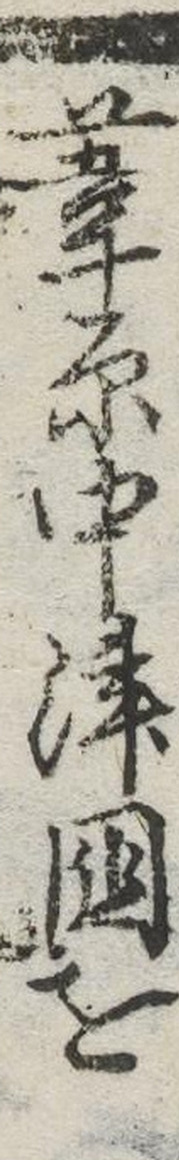葦原中津國を
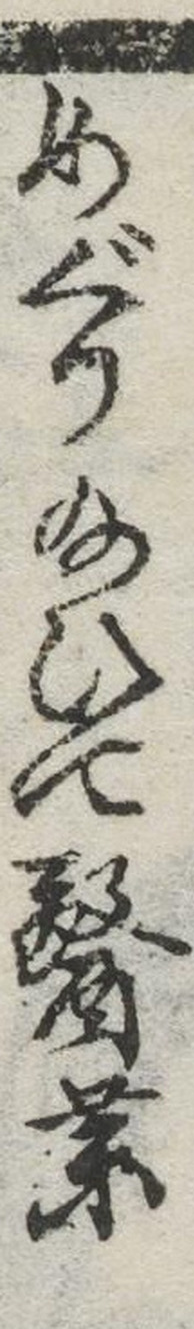めぐり給ひて醫藥
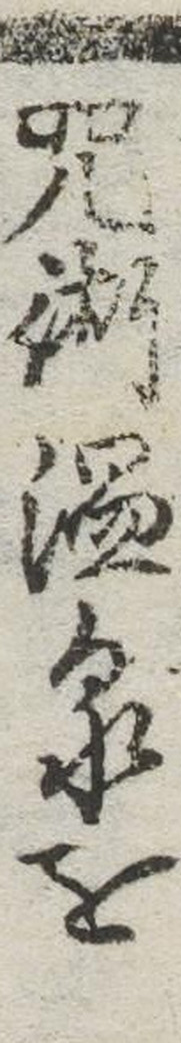呪術温泉を
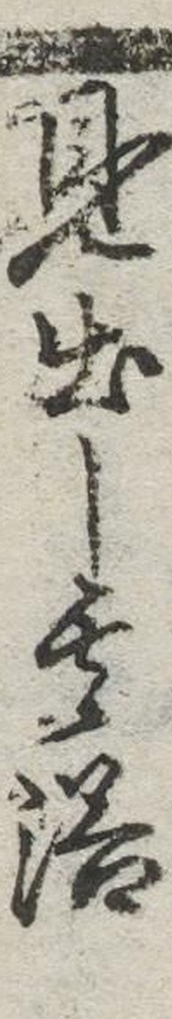見出し其浴

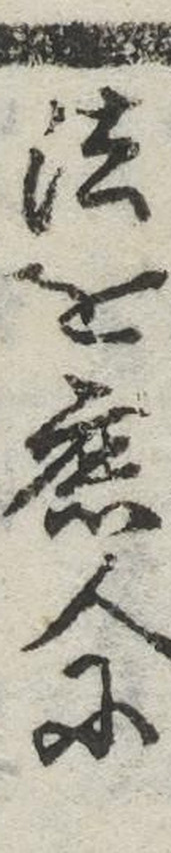法を庶人に
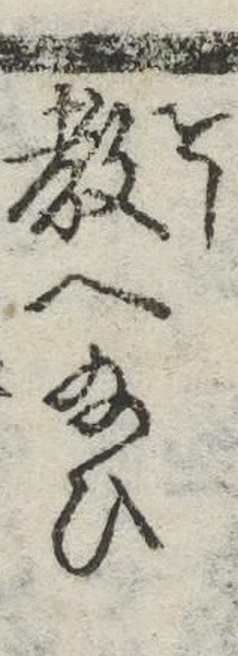教へ給ひ
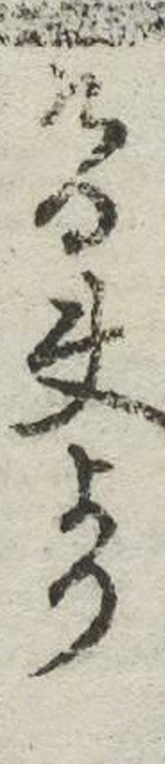ける夫より
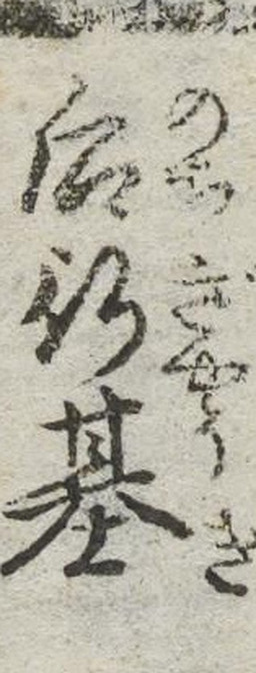后行基
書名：諸國温泉遊覽記　全
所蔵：東京大学地震研究所図書室 Earthquake Research Institute Library, The University of Tokyo, JAPAN
